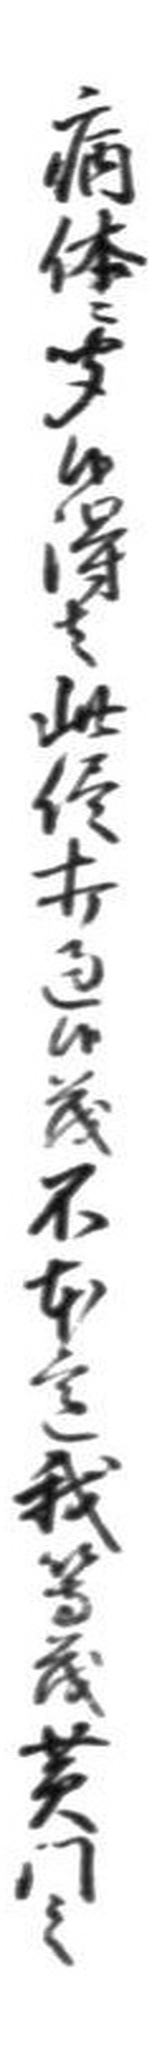病体ニ聞候得者此侭打過候も不本意我等も黄門之
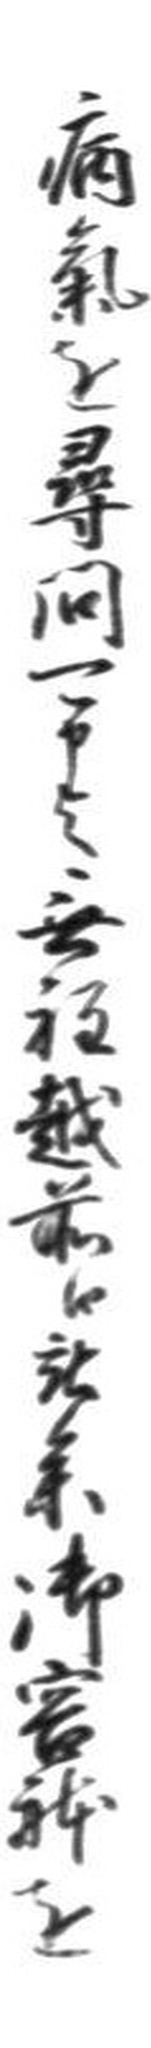病気を尋問可申と無程越前江被参御容体を
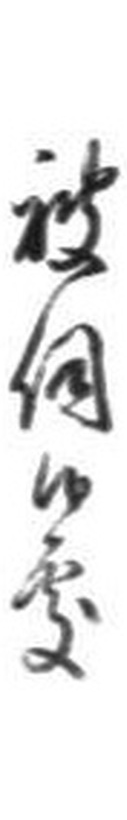被伺候処
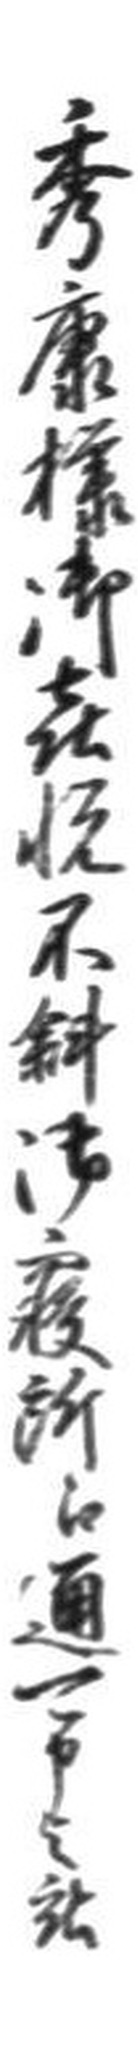秀康様御喜悦不斜御寝所江通可申と被
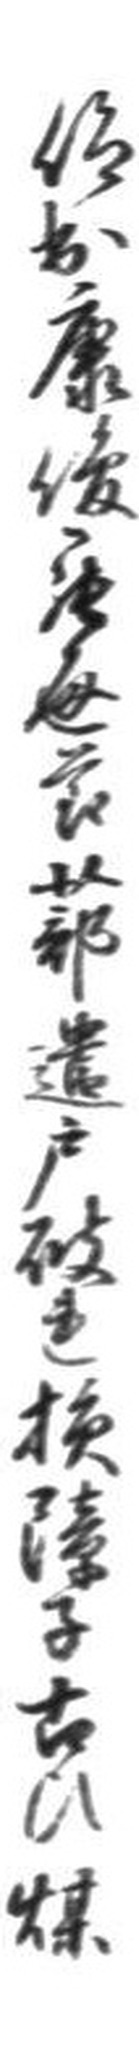仰出康俊罷通節蔀遣戸破れ損障子古ひ煤
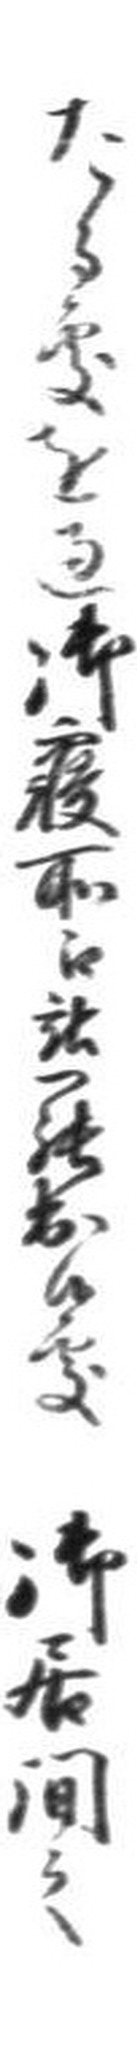たる処を過御寝所江被罷出候処御居間之
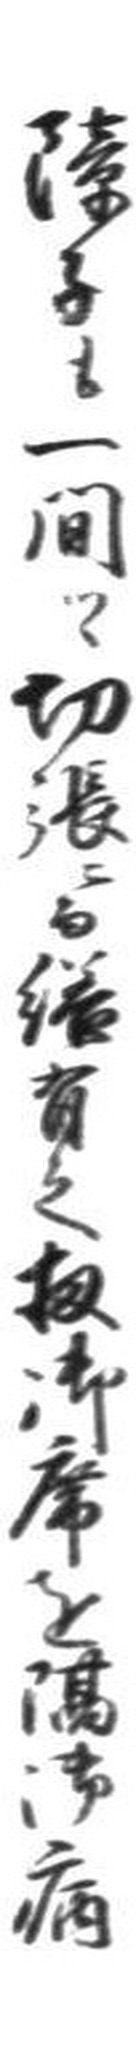障子も一間ツヽ切張ニ而繕有之扨御席を隔御病
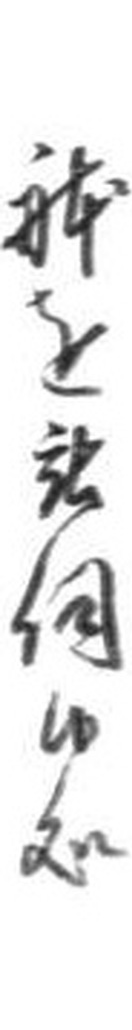体を被伺候処
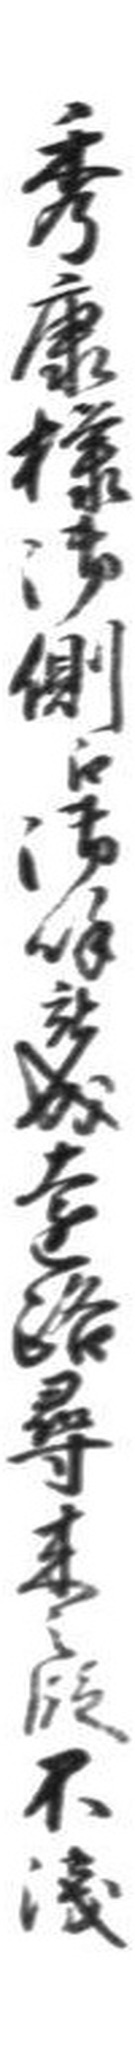秀康様御側江御呼被成遠路尋来之段不浅

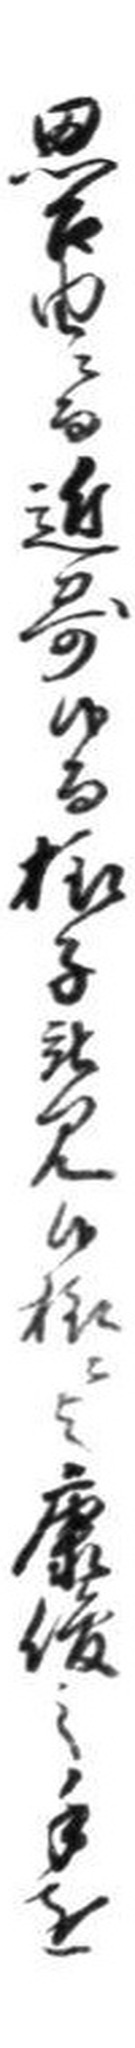思召由ニ而近寄候而様子被見候様ニと康俊之手を
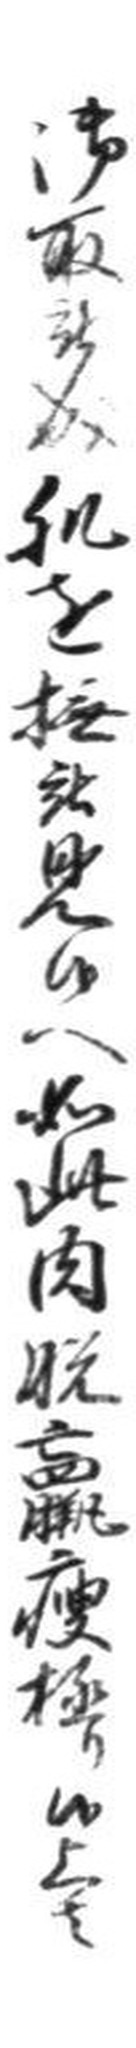御取被成肌を撫被見候へ如此肉脱羸痩極り候上者
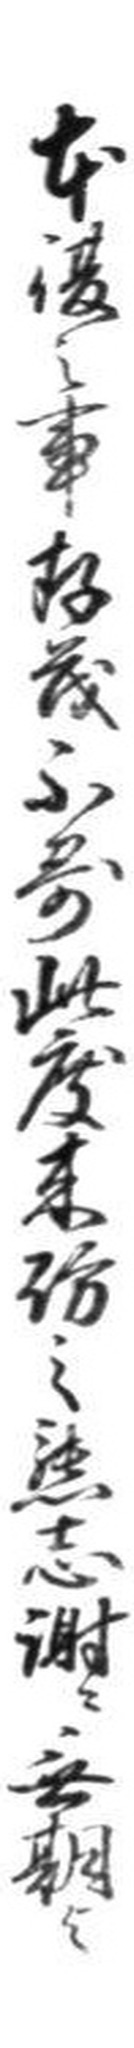本復之事存も不寄此度来訪之懇志謝ニ無期と
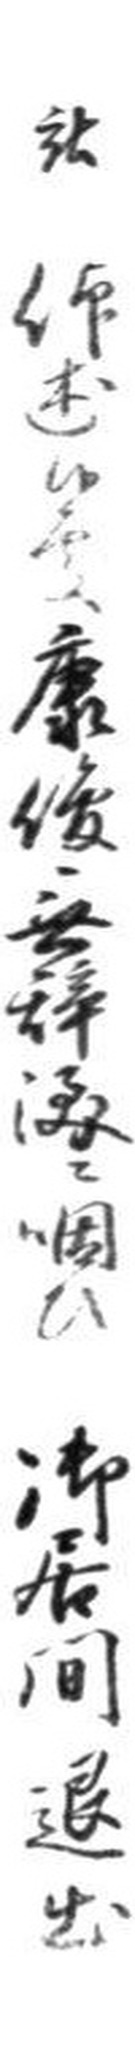被仰述候処康俊無辞涙ニ咽ひ御居間退出
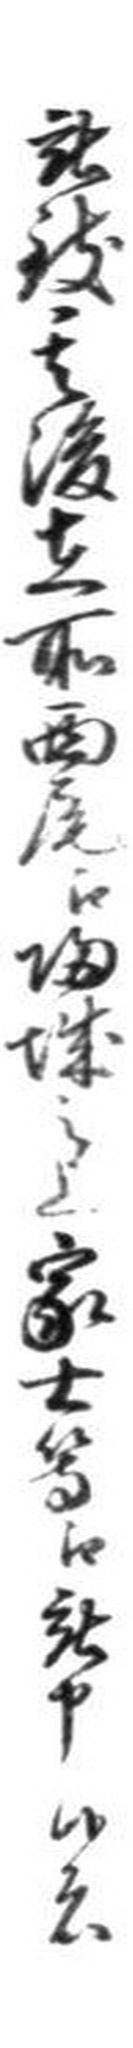被致其後在所西尾江帰城之上家士等ニ被申候者
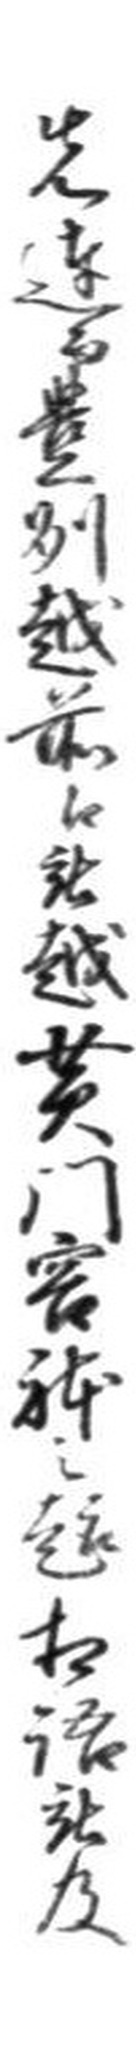先達而豊州越前江被越黄門容体之趣相語被及
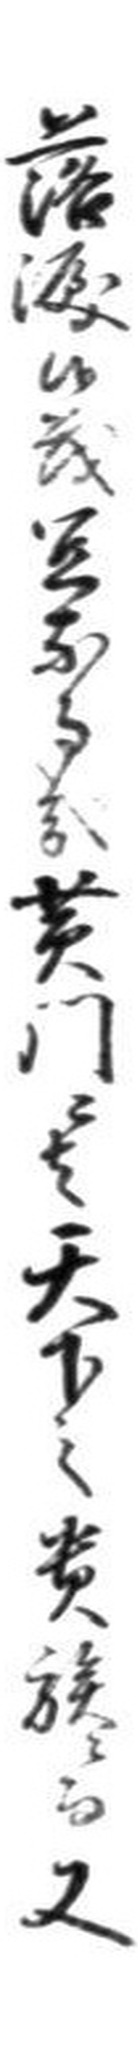落涙候も宜なる哉黄門ニ者天下之貴族ニ而又
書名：家譜 一 秀康公 従天正二年到慶長十二年
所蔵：福井県文書館 Fukui Prefectural Archives
